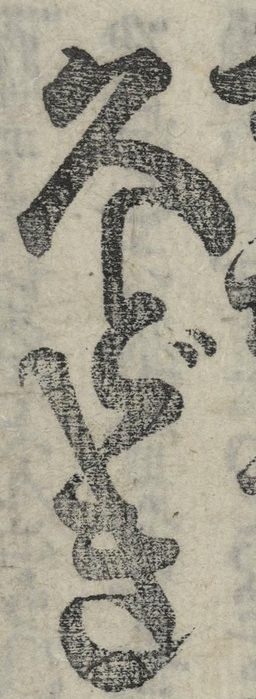くどき

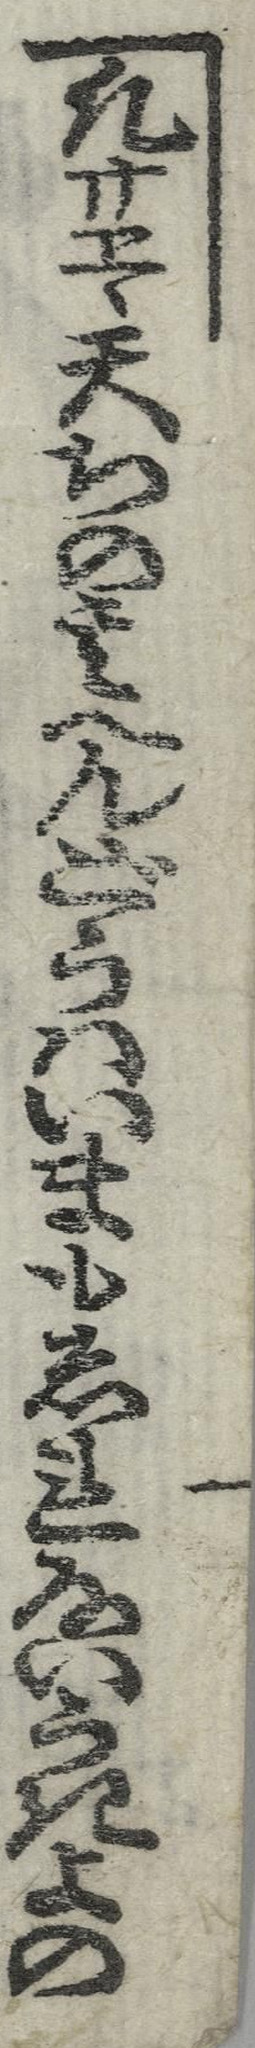〽凡サヱヽ天ちの其へんどうはいまもしれないうきよの
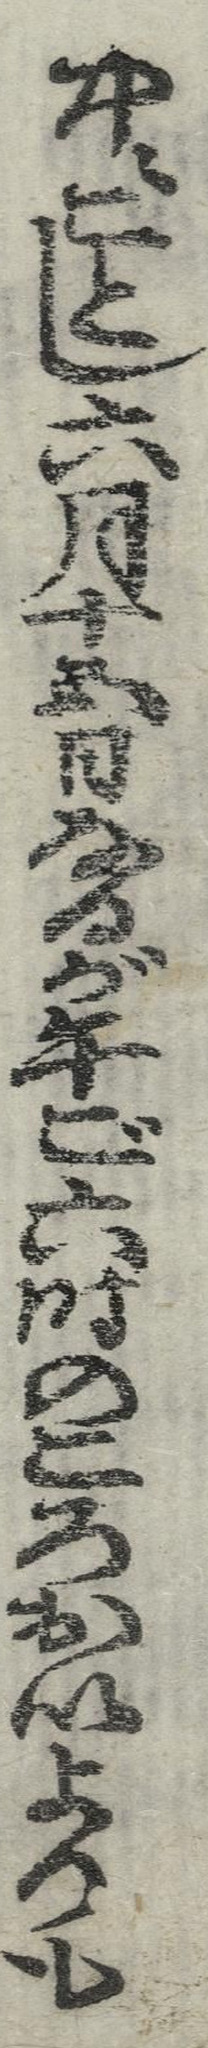中にことし六月十五日なるが午ご六時のころおいよりも
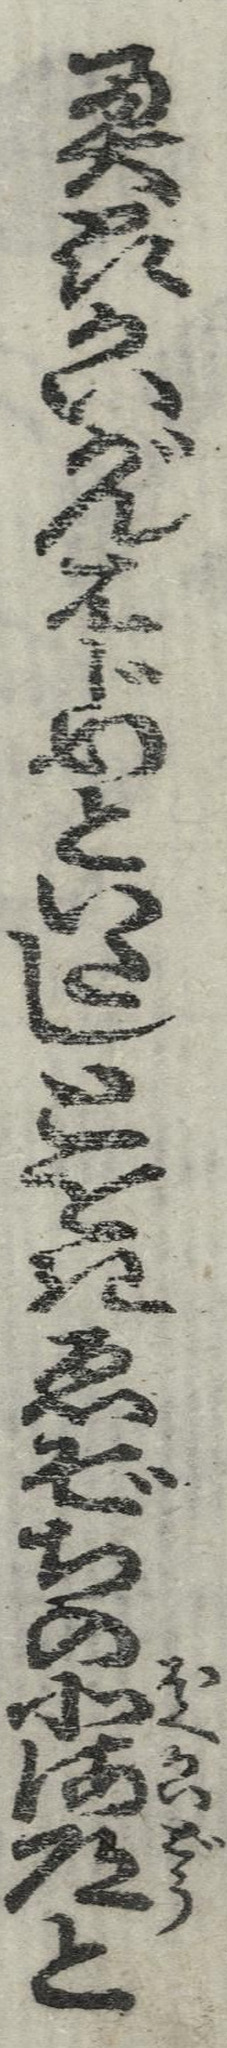奥州かいがんはじめといたしとをきゑぞちの北海道と
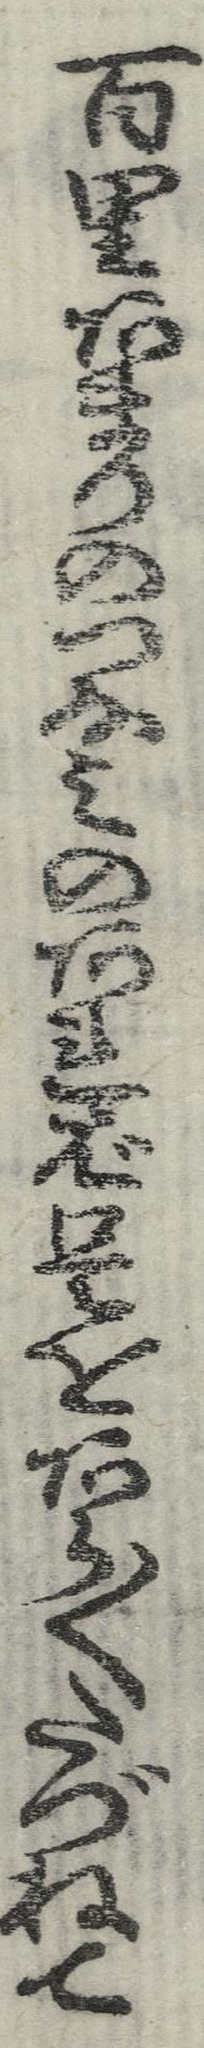百里あまりのつなみのあれば是をあら〳〵たづねて
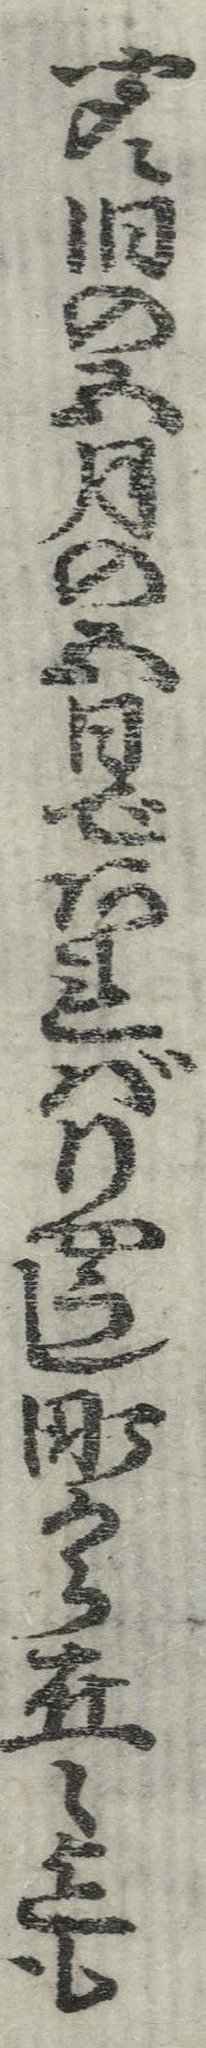聞に旧の五月の五日であればりやうし町から在々迄も
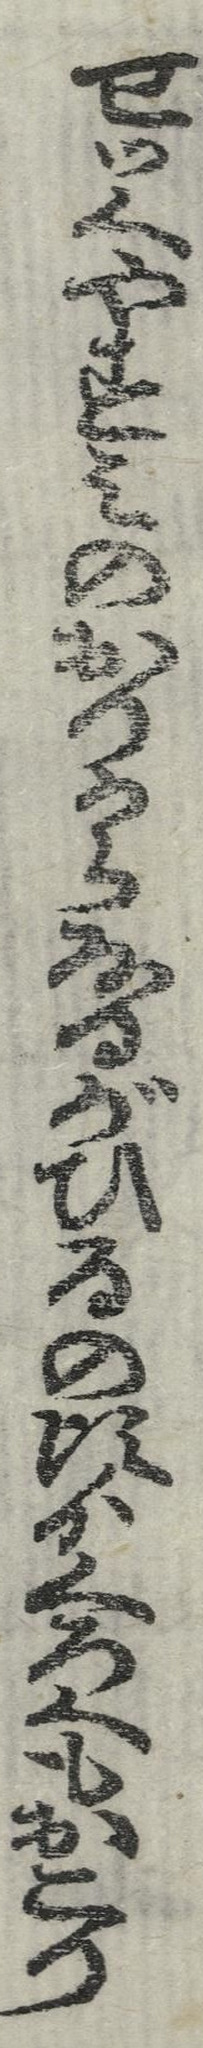せつくやすみのおりからなるがひるの頃ゟくろくもおこり
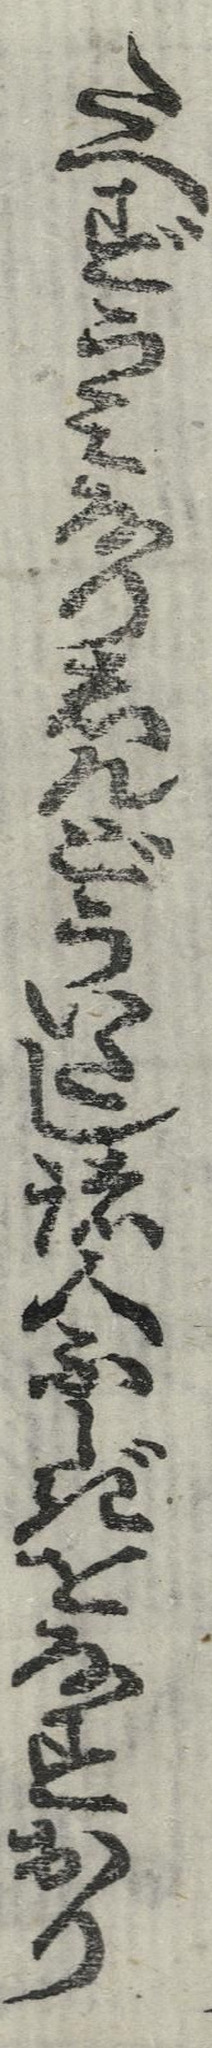たへずうみなりしんどういたし諸人ふしぎをなすおり
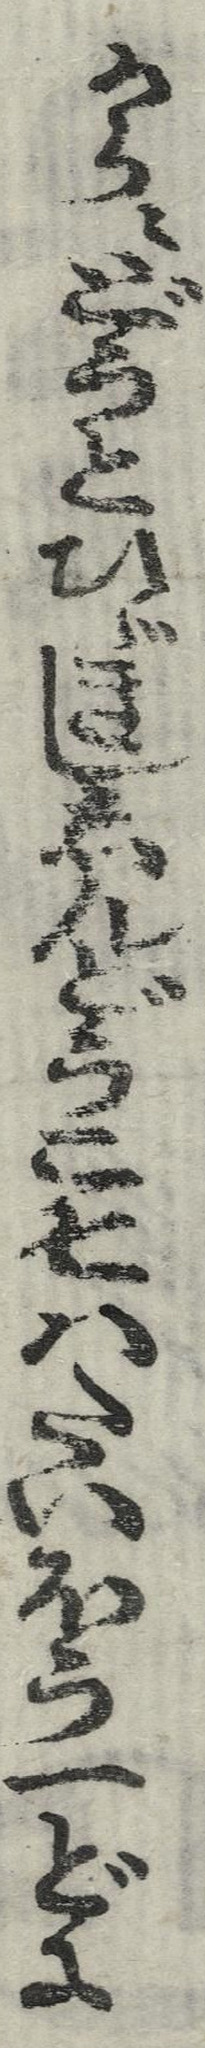からにどうとひゞきししんどうこそはたいほう一どに
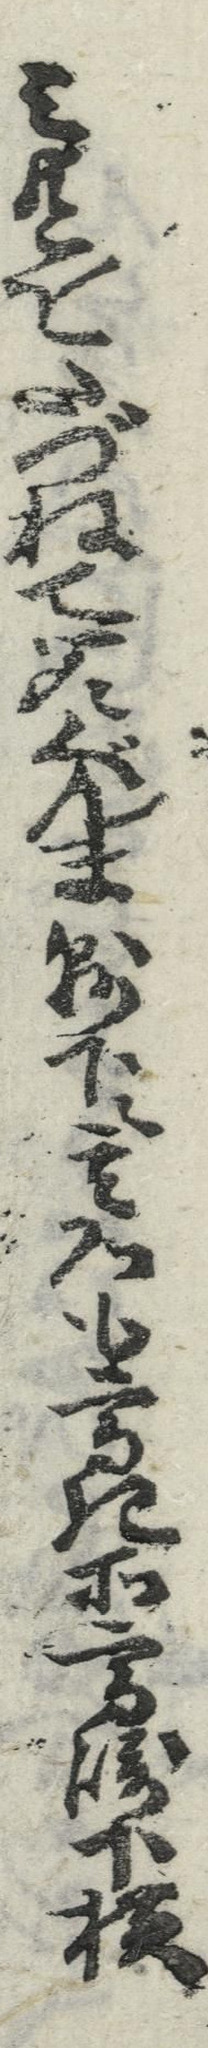みもとをたづねて聞にぐんま縣下に其なも高き所高崎下横
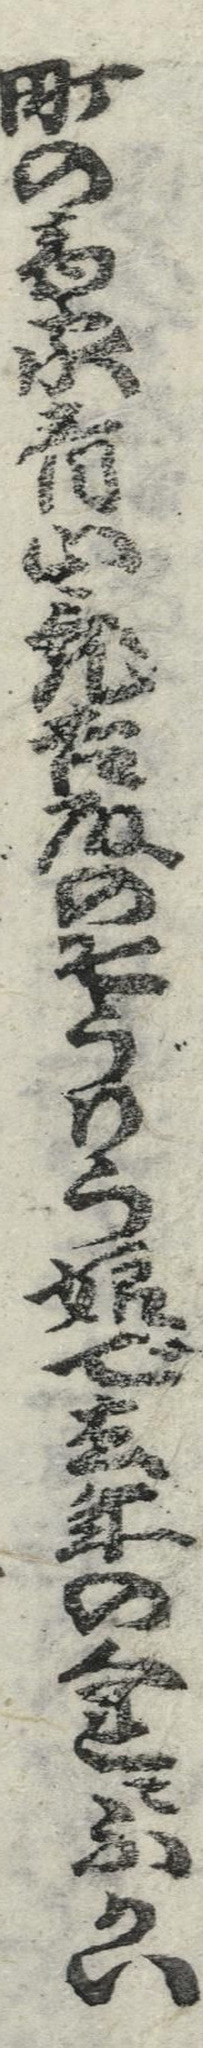町の商家青山蔵吉殿のそうりう娘で去年のくれにふかい
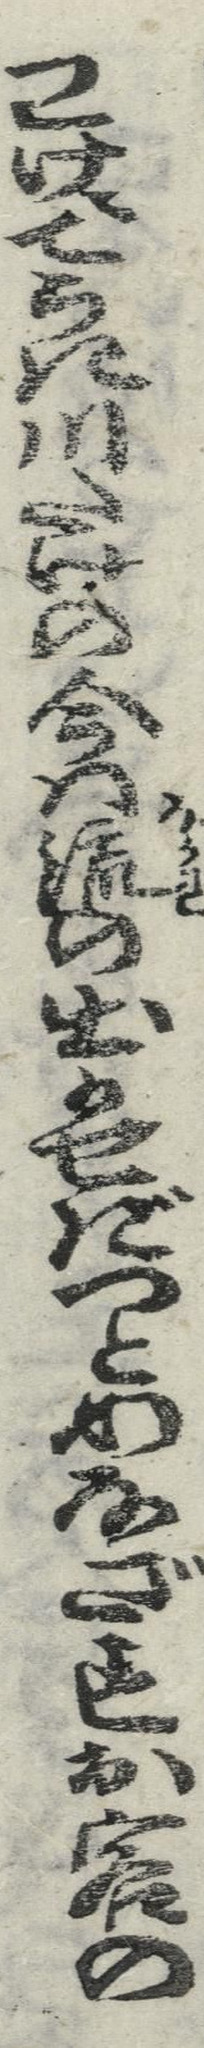わけにてうき川たけの今は流の出かせぎつとめなざすお客の
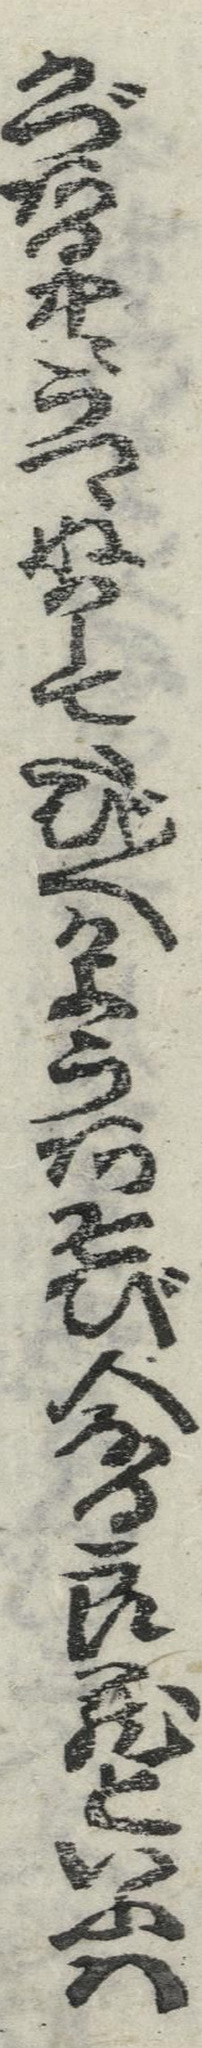かづある中にうつゝぬかしてたび〳〵かようあそび人なる良蔵といふは
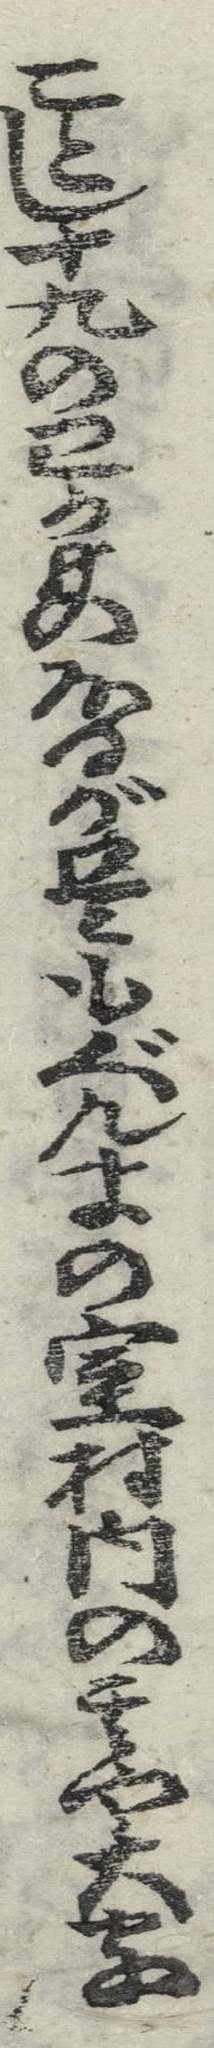ことし十九のわか夫なるが是もぐんまの室村内の其や大字
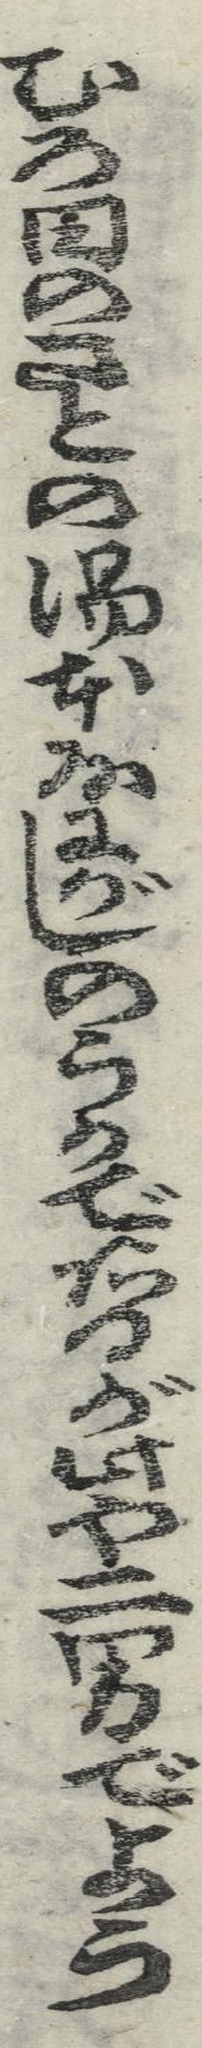むろ田のさとの湯本なにがしのうかであるが此や二男でよう
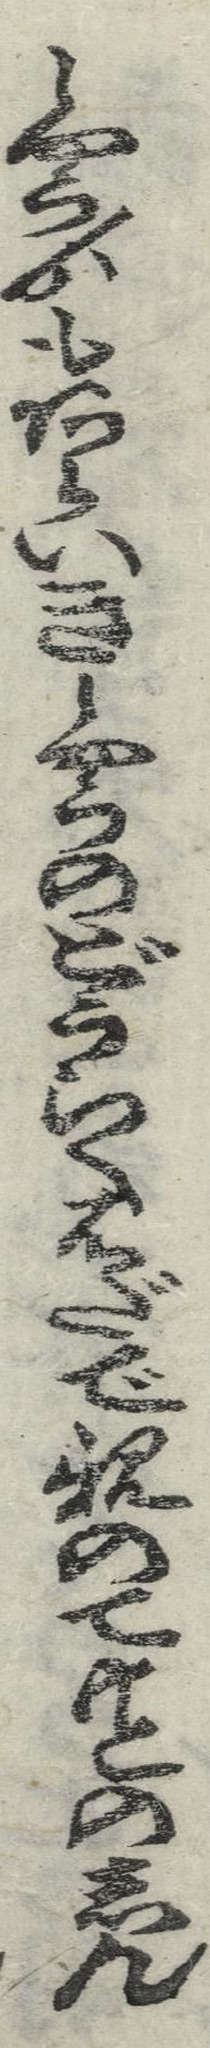しやらゟもあらいきしやうのどうらくはだで親のてもとのしん
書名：奥州すじ大つなみおおあれくどき
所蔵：東京大学地震研究所図書室 Earthquake Research Institute Library, The University of Tokyo, JAPAN
